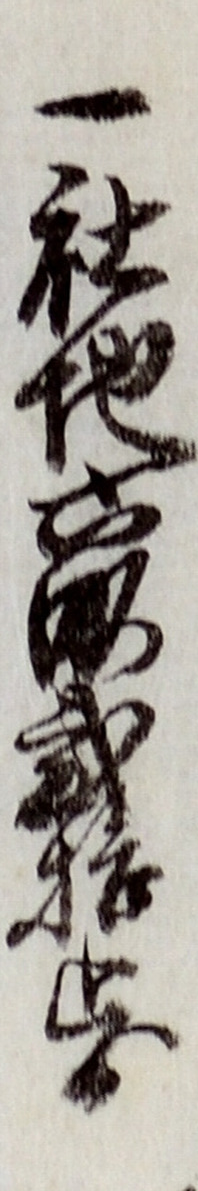一社地六畝弐拾ぶ山神
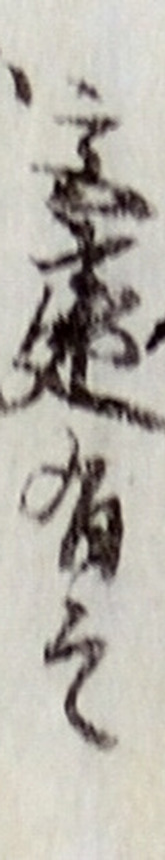宮建有之
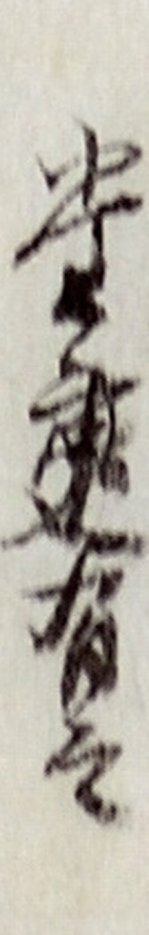堂建有之

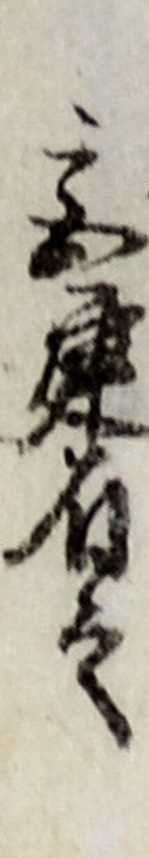堂建有之
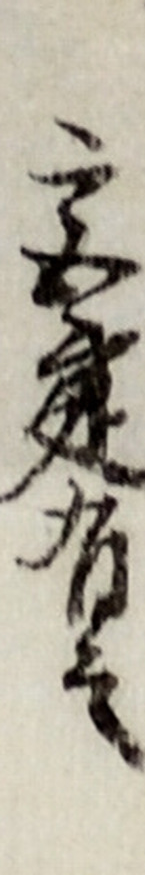堂建有之
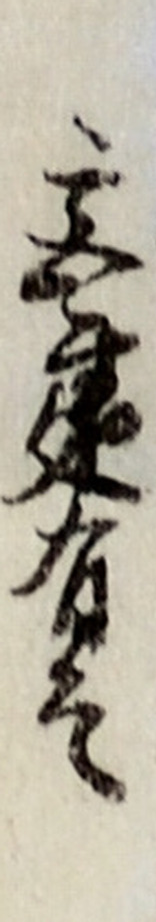堂建有之
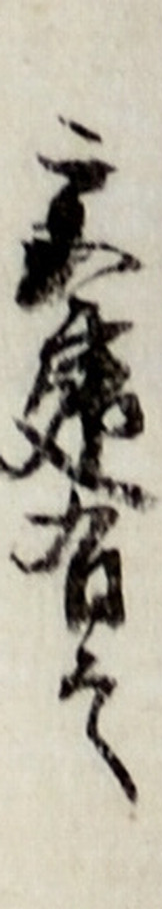堂建有之
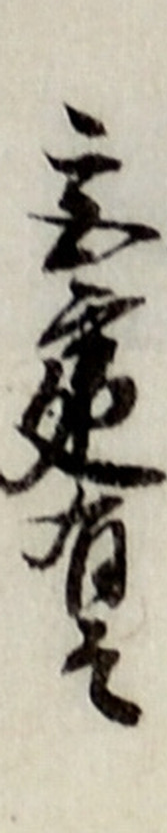堂建有之
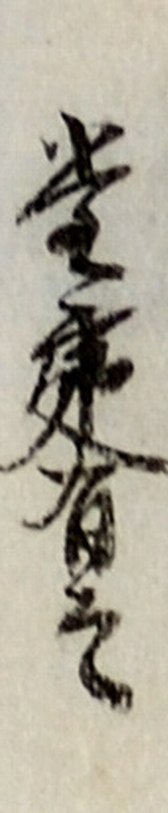堂建有之
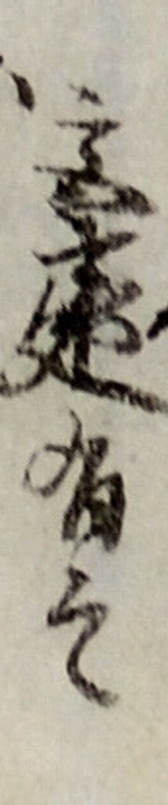堂建有之

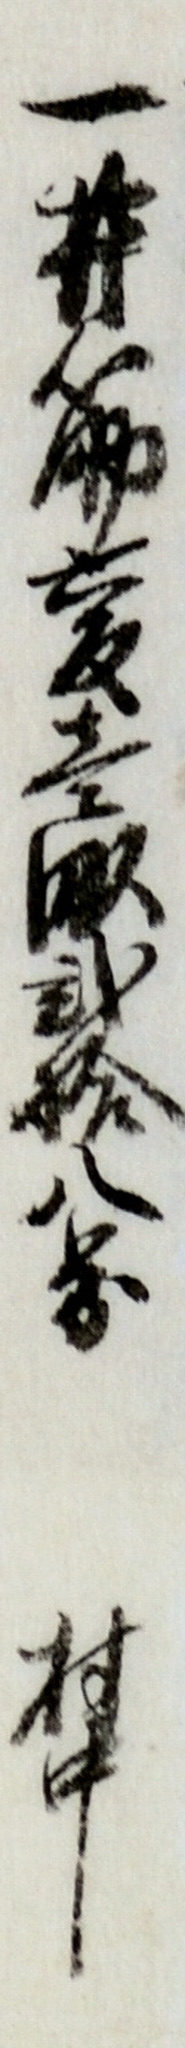一井筋六反壱畝弐拾八歩村中
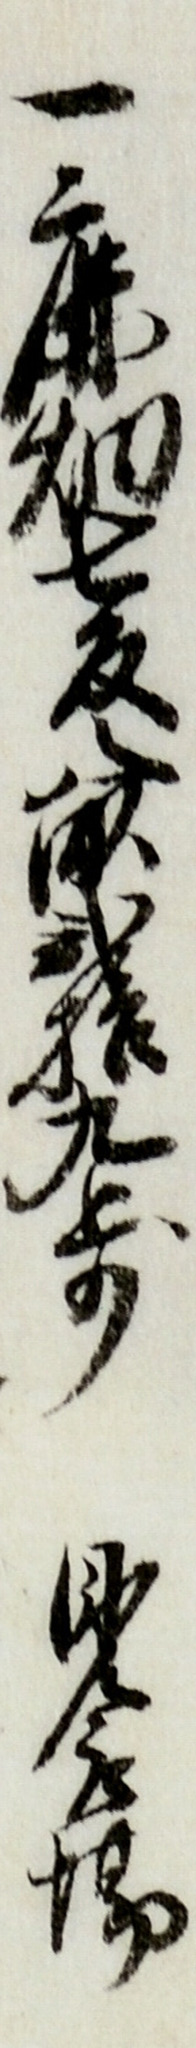一麻畑七反八畝弐拾九歩見取場
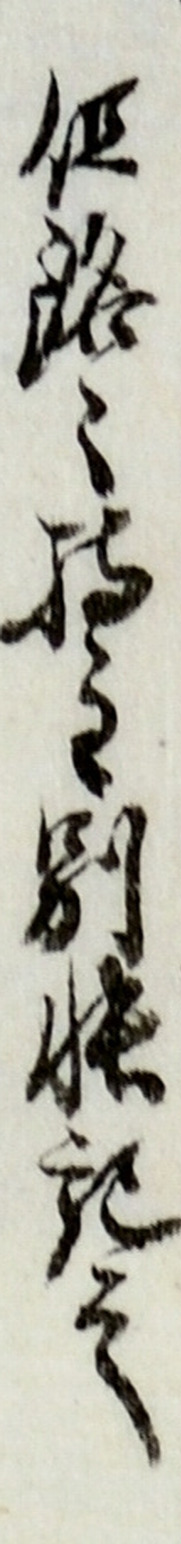但銘々持主別帳記之
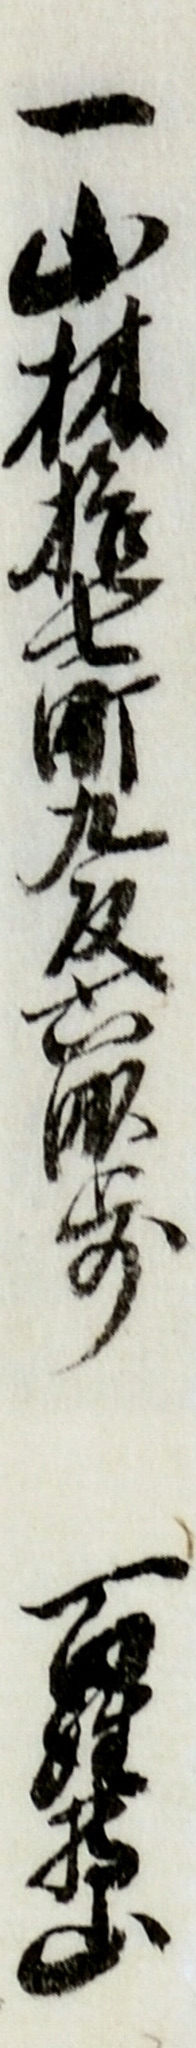一山林拾七町九反六畝歩百姓持山
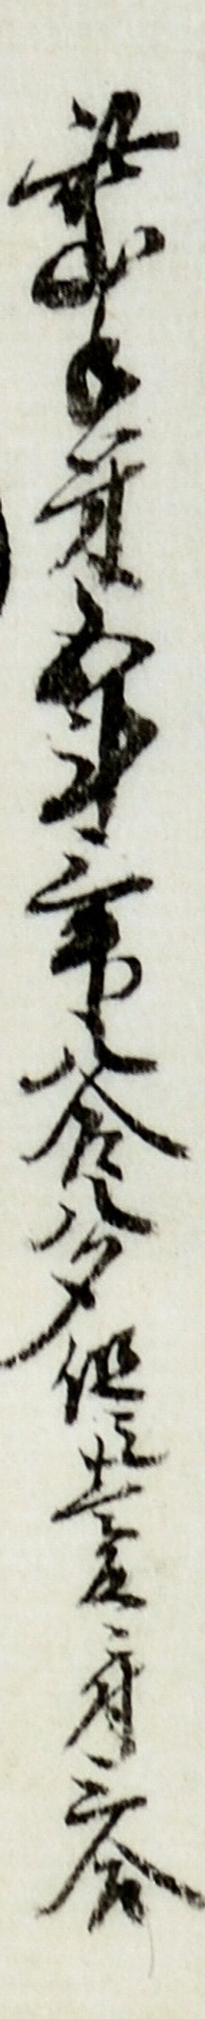此山手米五斗三升八合八勺但シ壱反ニ付三合
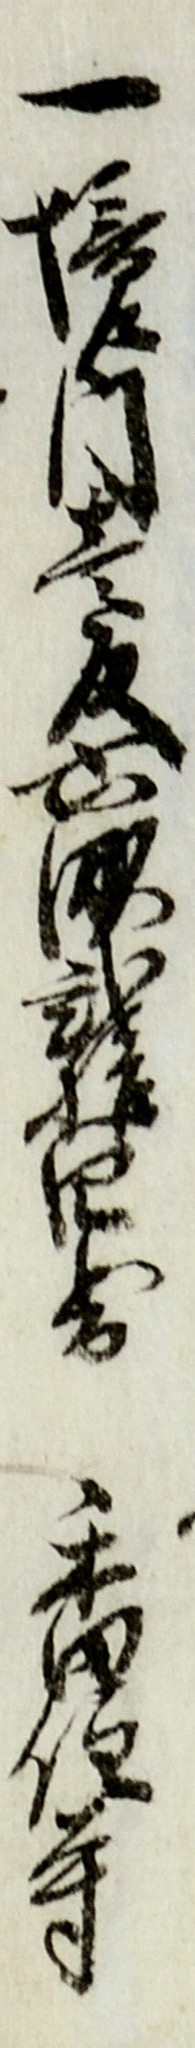一境内壱反六畝弐拾四歩香住寺
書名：御領分中山林社地手控
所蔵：伊那市立高遠町図書館・合同会社AMANE
